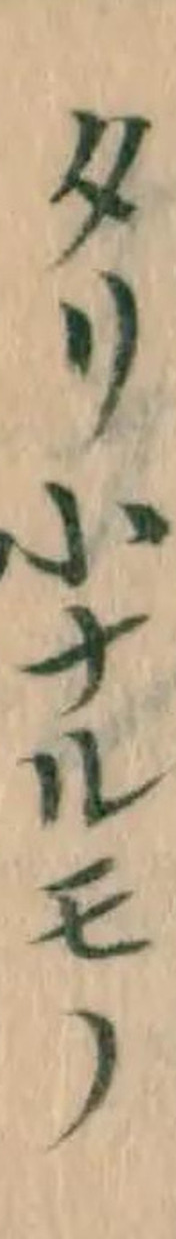タリ小ナルモノ
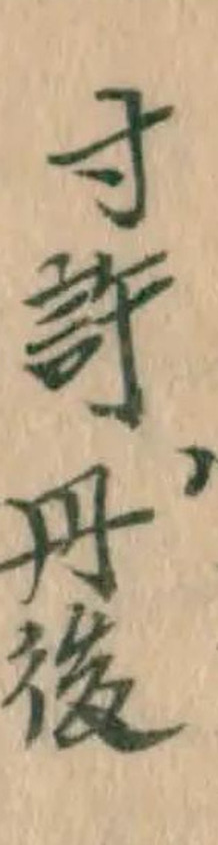寸許丹後
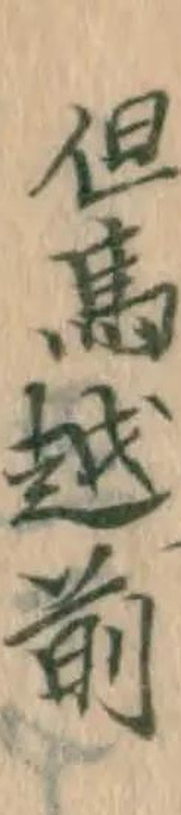但馬越前
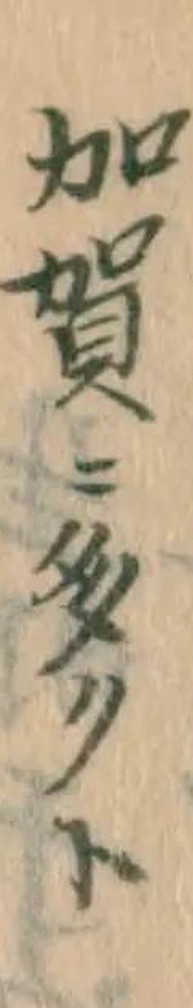加賀ニ多クト
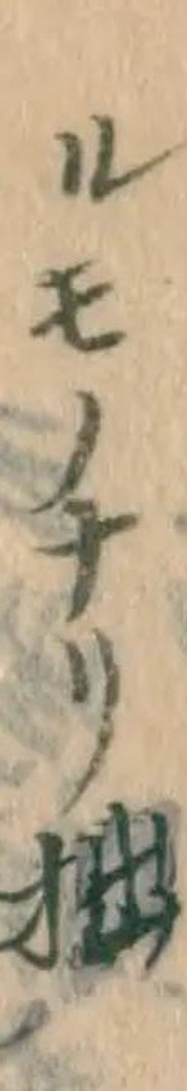ルモノナリ拙
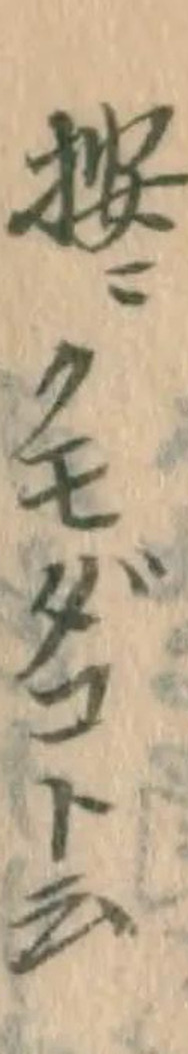按ニクモダコト云
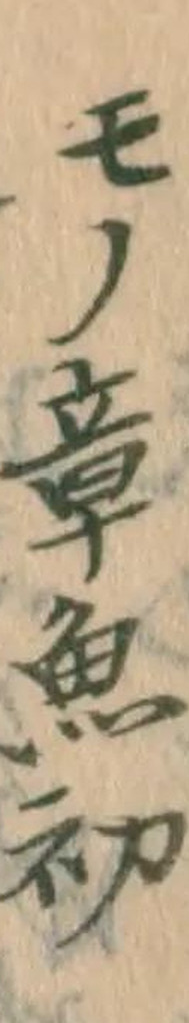モノ章魚初
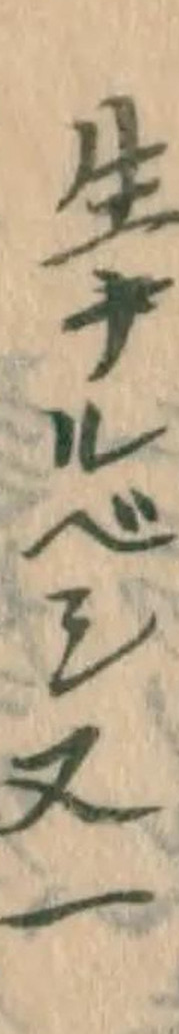生ナルベシ又一
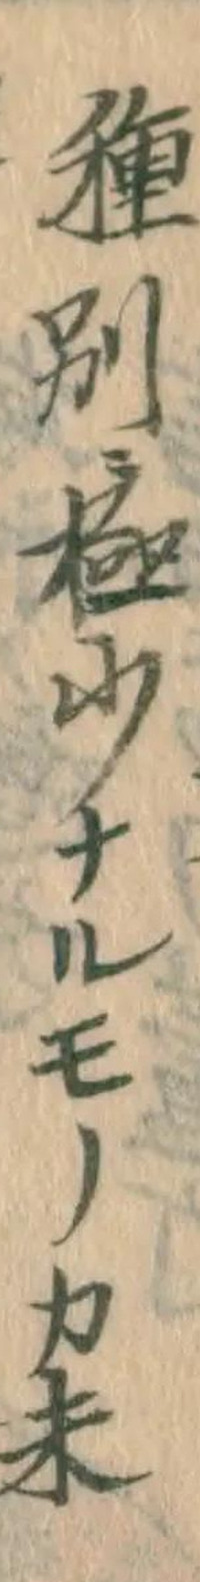種別ニ極小ナルモノカ未
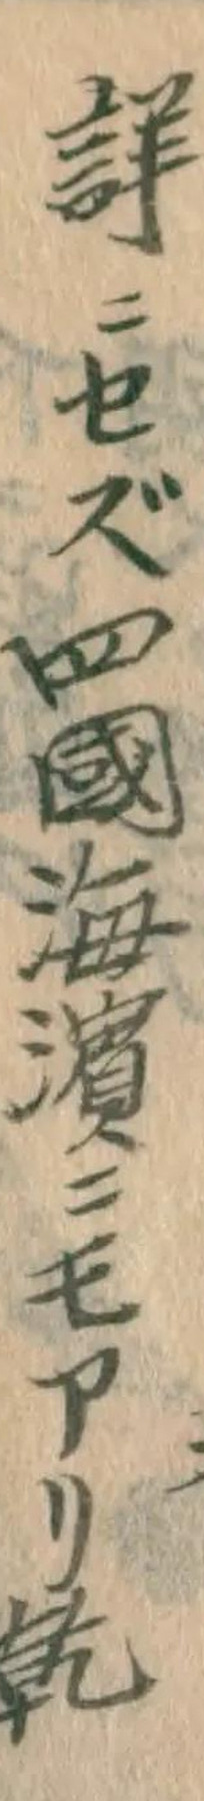詳ニセズ四國海濱ニモアリ乾
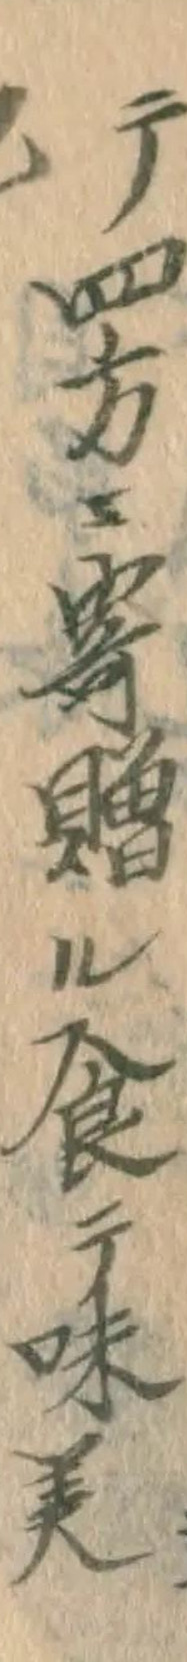テ四方ニ寄贈ル食テ味美

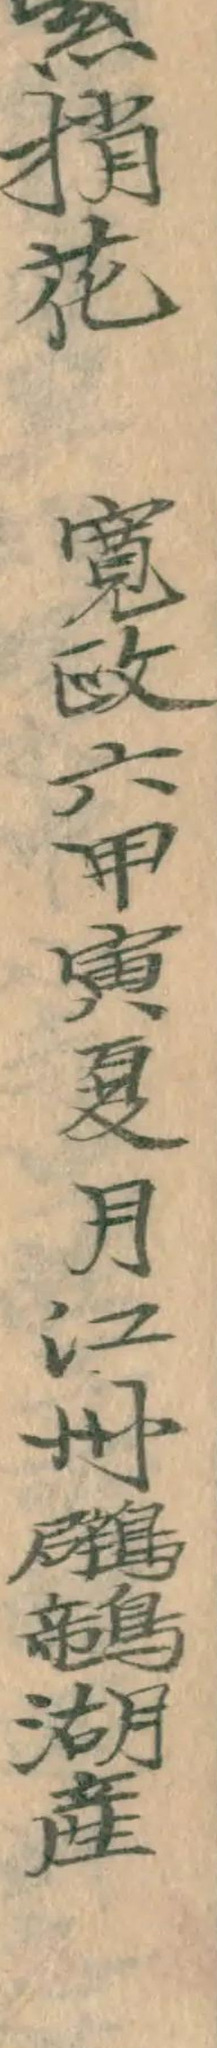紫稍花寛政六甲寅夏月江州鸊鶙湖産
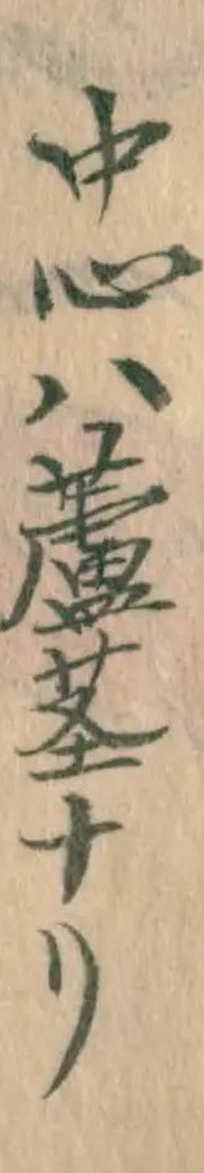中心ハ蘆茎ナリ
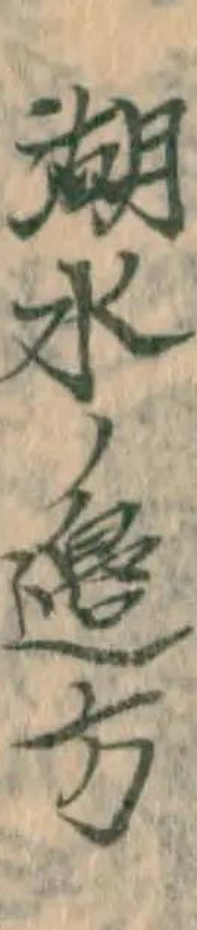湖水ノ邉方
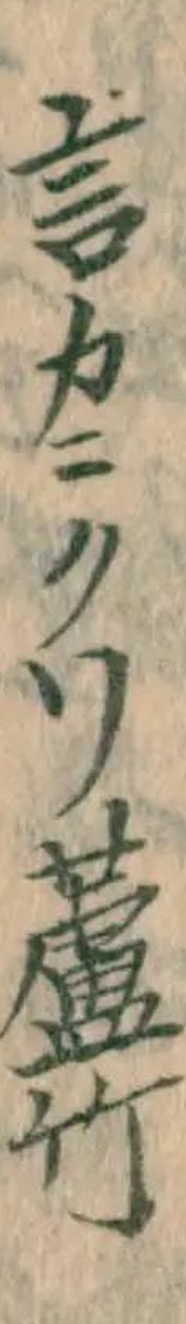言カニクワ蘆竹
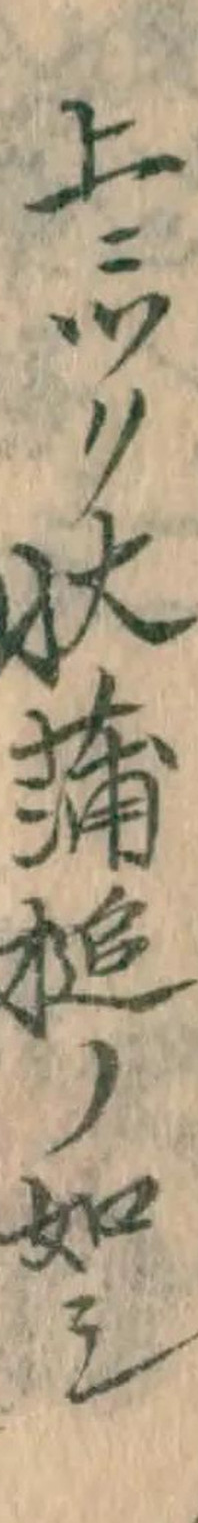上ニツク状蒲槌ノ如シ
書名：千蟲譜 3巻. [2]
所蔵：国立国会図書館 National Diet Library, JAPAN
